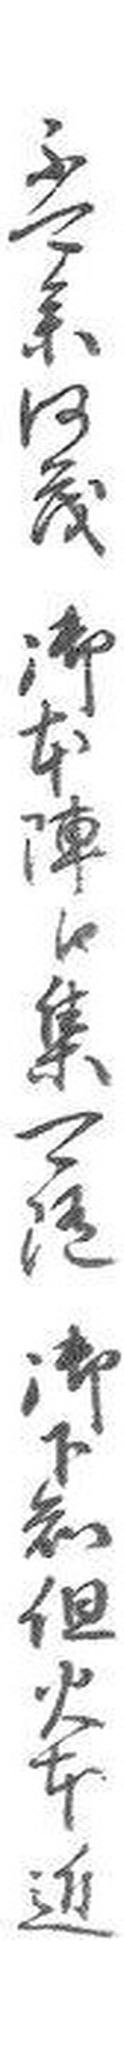不可参何茂御本陣江集可随御下知但火本近
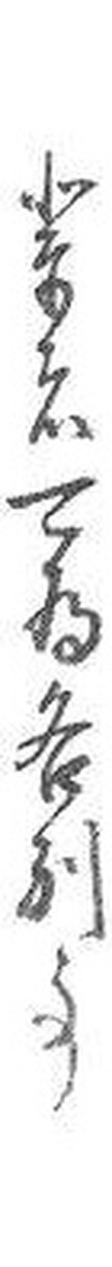輩者可為各別事
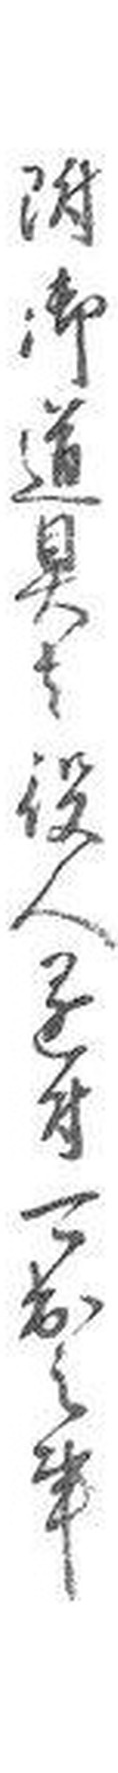附御道具者役人懸付可出之事
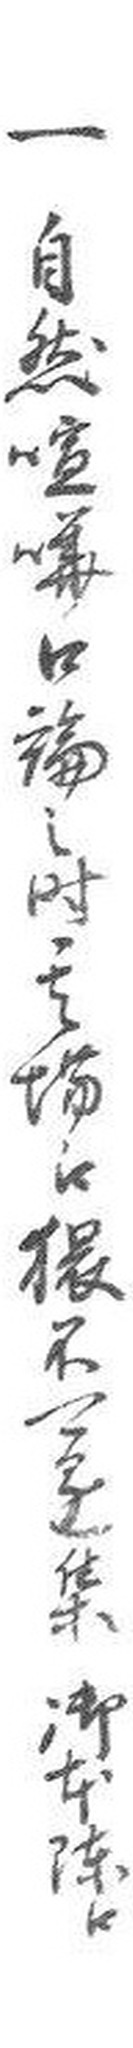一自然喧嘩口論之時其場江猥不可懸集御本陣江
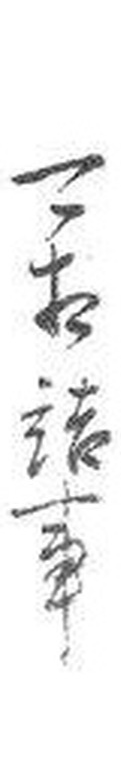可相詰事
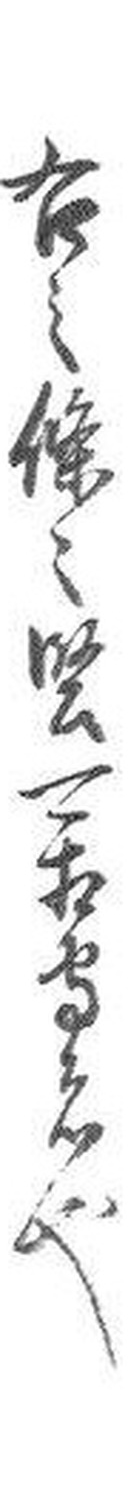右之条々堅可相守者也
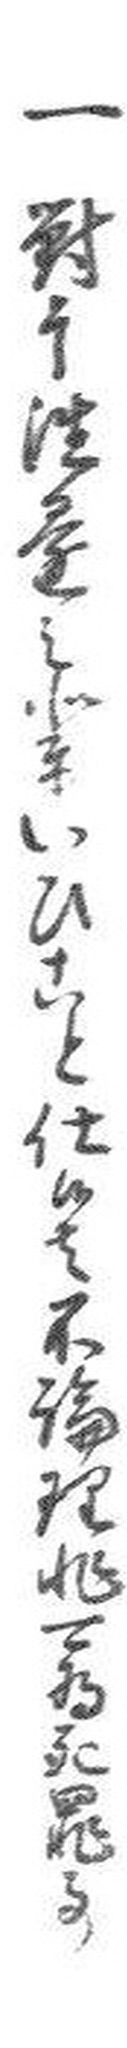一対于往還之輩いひこと仕候者不論理非可為死罪事
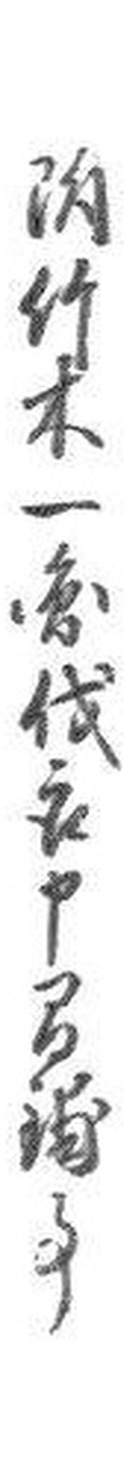附竹木一円伐取申間鋪事
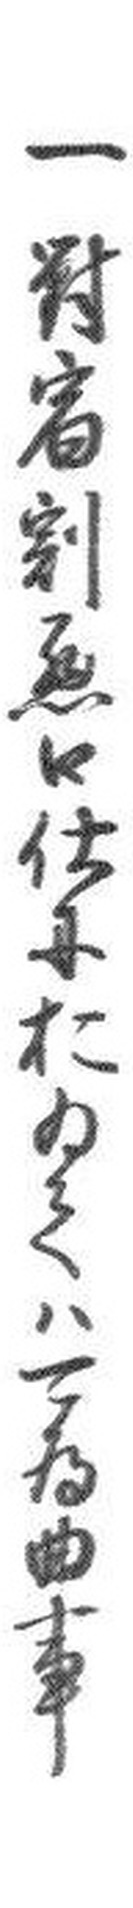一対宿割悪口仕にをゐてハ可為曲事
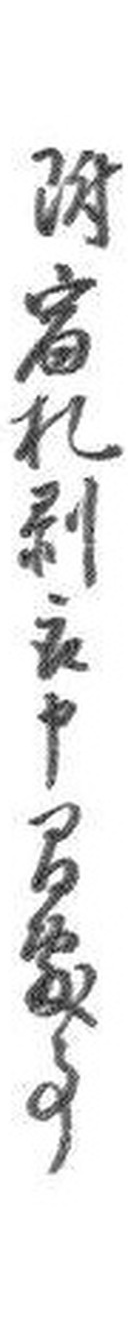附宿札剝取申間敷事
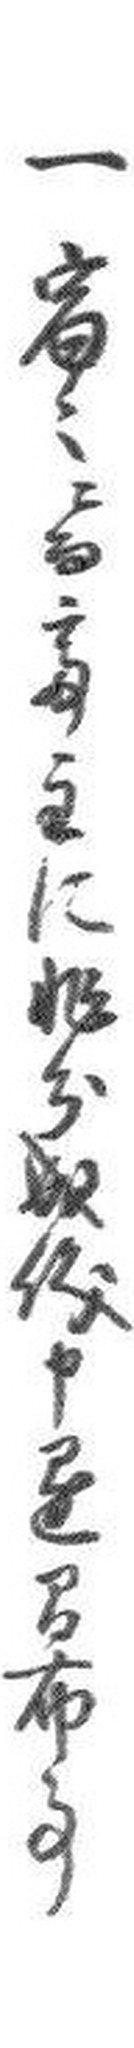一宿々ニ而亭主に非分成儀申懸間布事
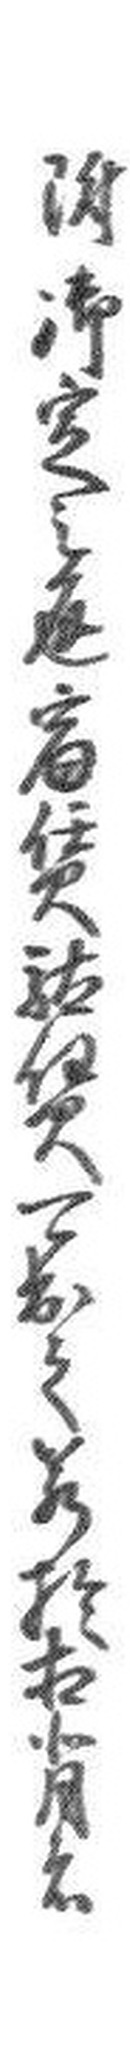附御定之通宿賃駄賃可出之若於相背者
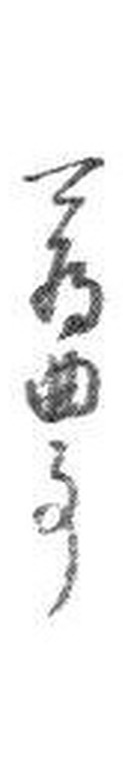可為曲事
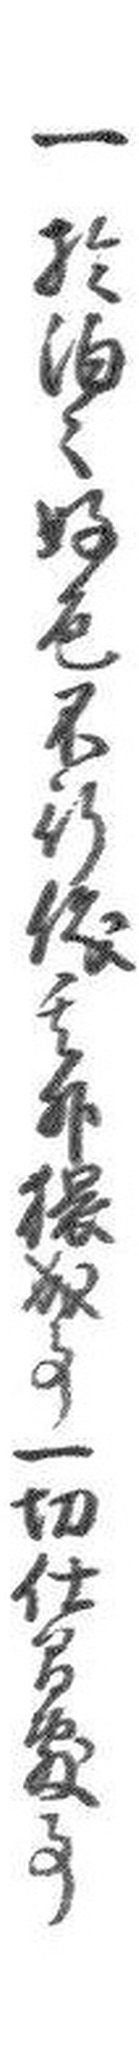一於泊々好色不行儀其外猥成事一切仕間敷事
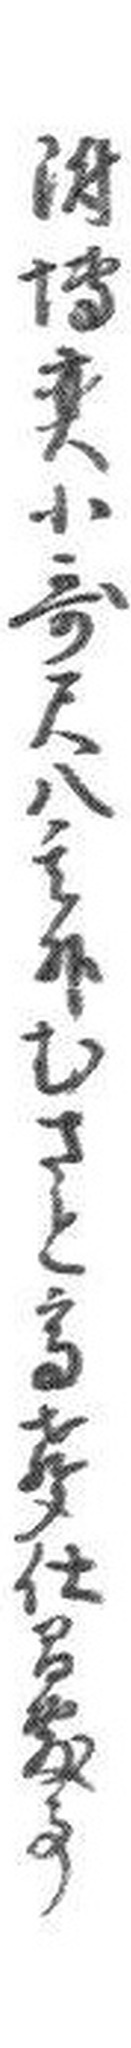附博奕小歌尺八其外むさと高声仕間敷事
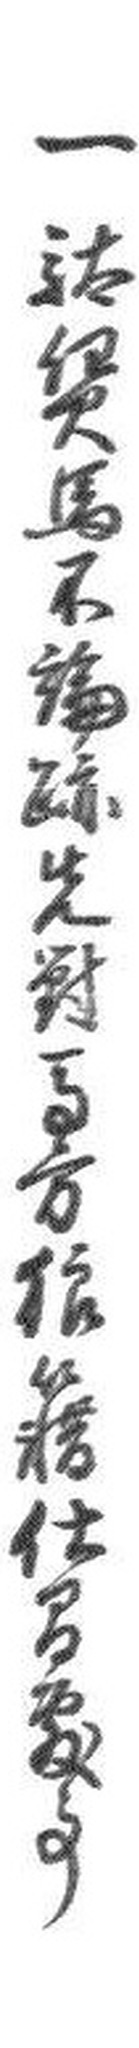一駄賃馬不論跡先対馬方狼藉仕間敷事
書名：家譜 五 光通公 従寛永十三年到万治二年
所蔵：福井県文書館 Fukui Prefectural Archives
